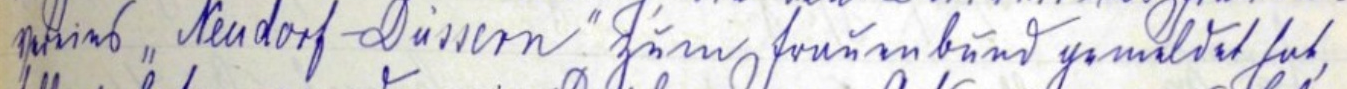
vereins „Neudorf-Düssern“ zum Frauenbund gemeldet hat
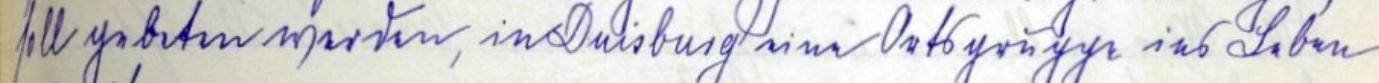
soll gebeten werden in Duisburg eine Ortsgruppe ins Leben
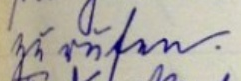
zu rufen.
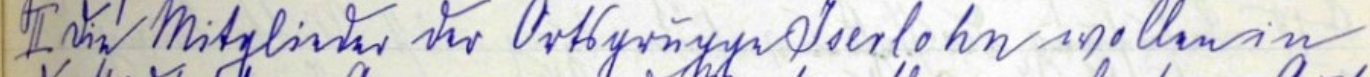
II Die Mitglieder der Ortsgruppe Iserlohn wollen in
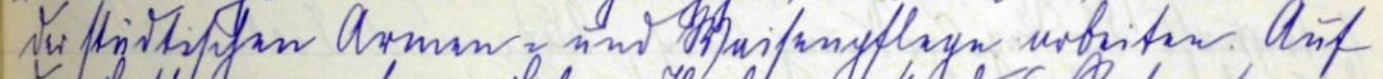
der städtischen Armen- und Waisenpflege arbeiten. Auf
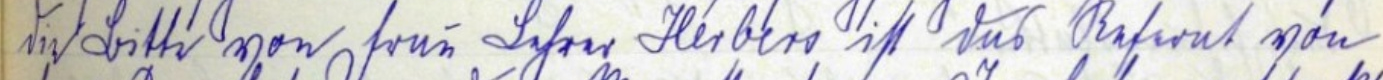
die Bitte von Frau Lehrer Herbers ist das Referat von
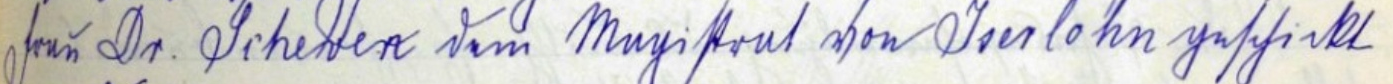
Frau Dr. Schehren dem Magistrat von Iserlohn geschickt
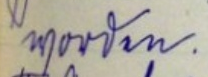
worden.
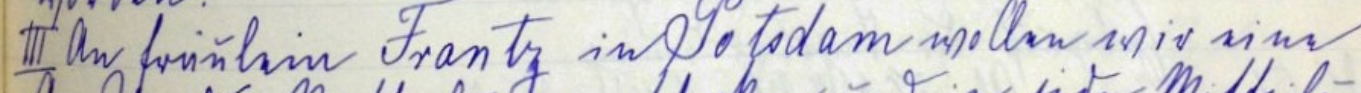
III Fräulein Frantz in Potsdam wollen wir eine
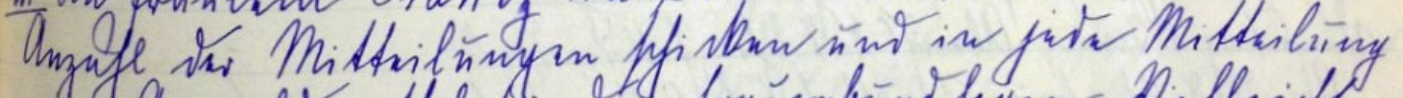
Anzahl der Mitteilungen schicken und in jede Mitteilung
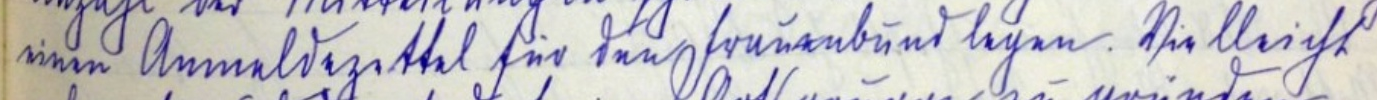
einen Anmeldezettel für den Frauenbund legen. Vielleicht
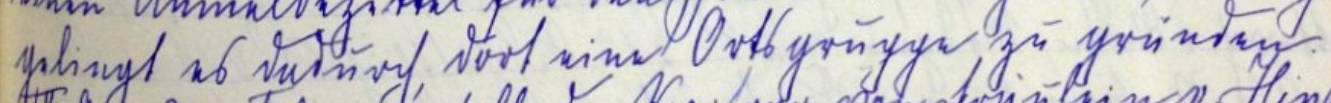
gelingt es dadurch, dort eine Ortsgruppe zu gründen.
